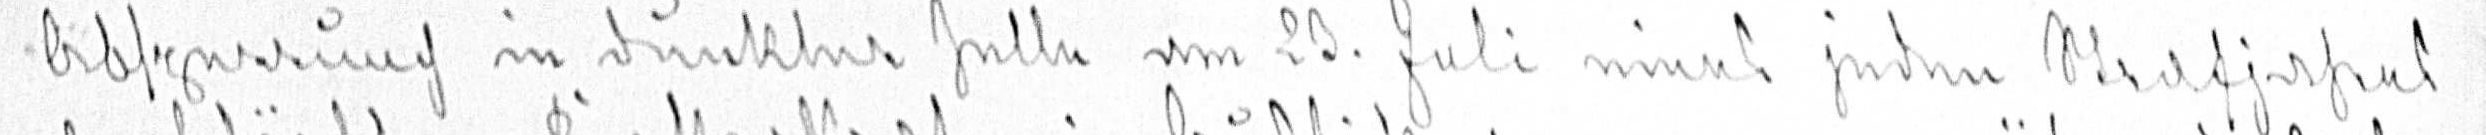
Absperrung in dunkler Zelle am 23. Juli eines jeden Strafjahres
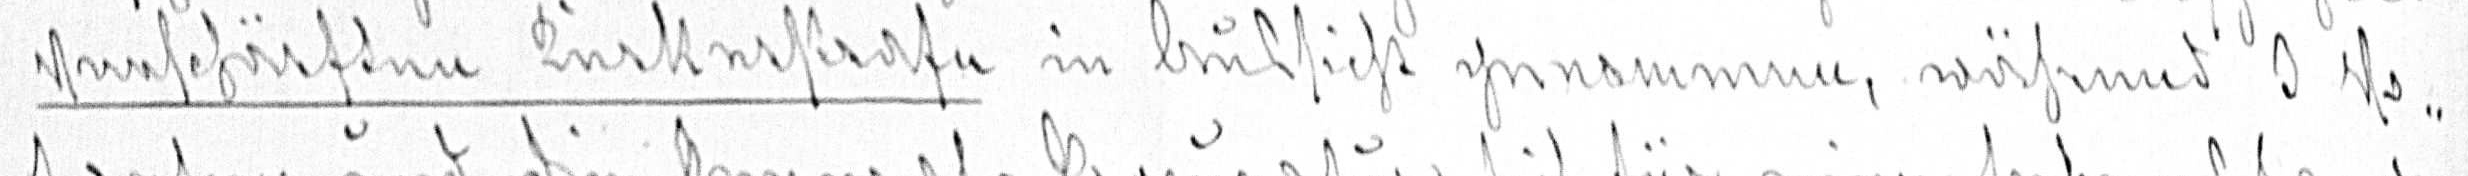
verschärften Kerkerstrafe in Aussicht genommen, währen 3 Vo¬
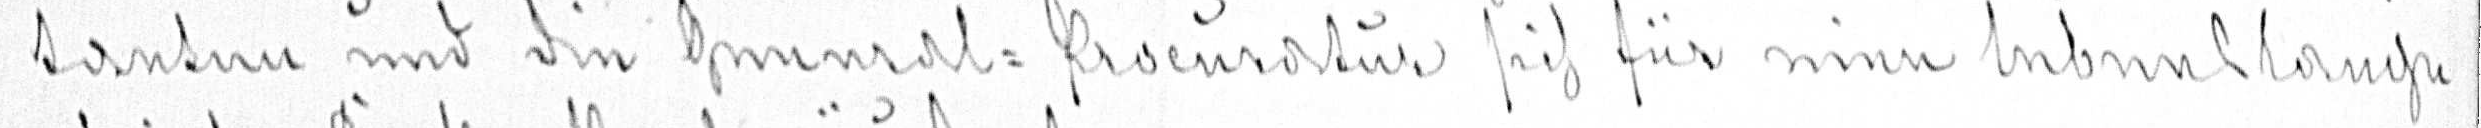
tanten und die General-Procuratur sich für eine lebenslange
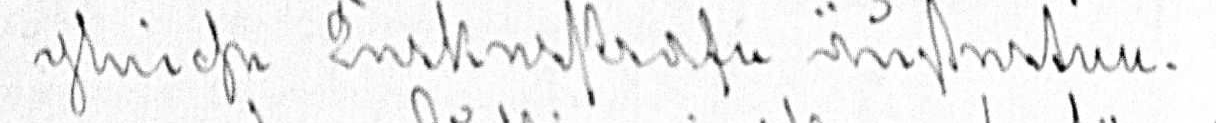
gleiche Kerkerstrafe äußerten.
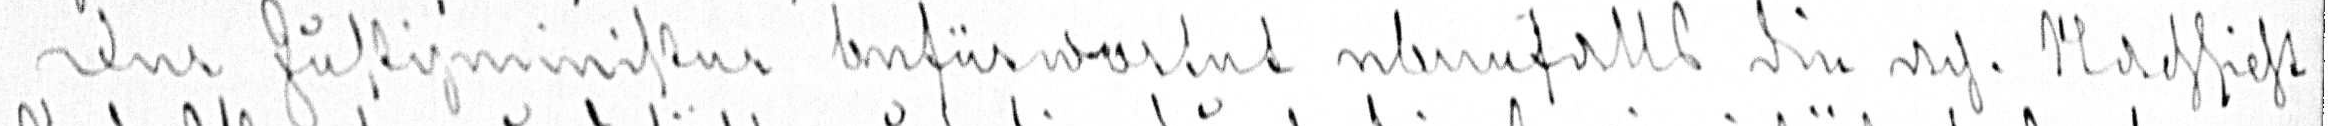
Der Justizminister befürwortet ebenfalls die ag. Nachsicht
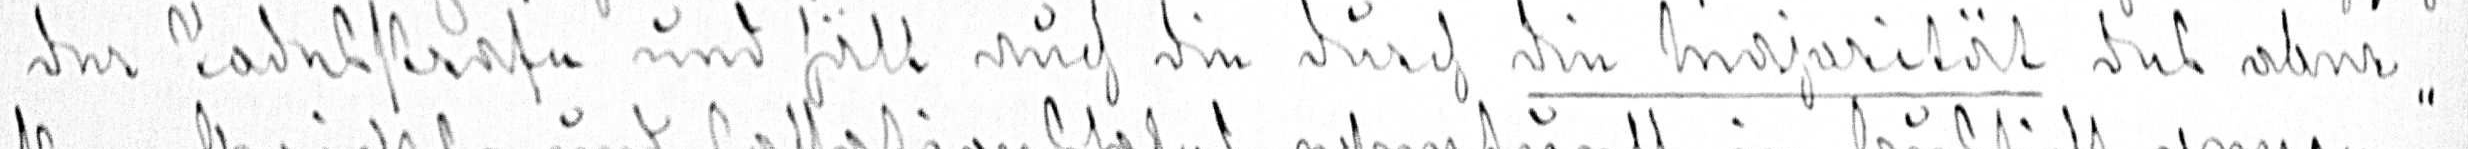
der Todesstrafe und hält auch die durch die Majorität des ober¬
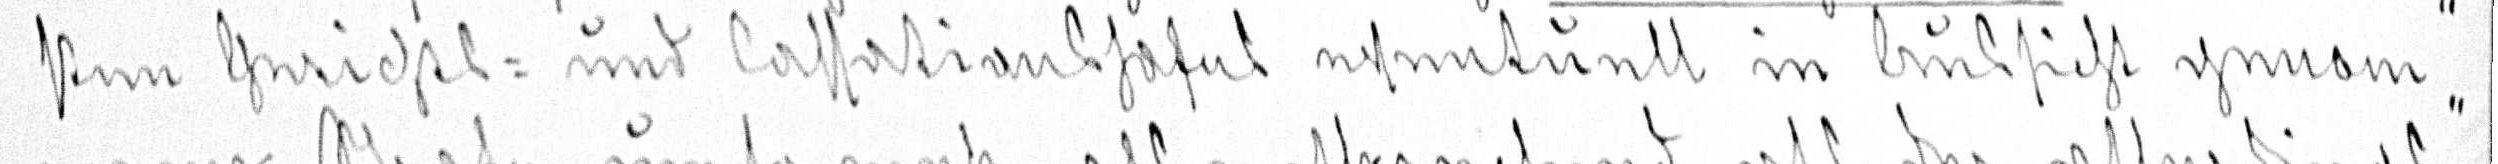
sten Gerichts- und Cassationshofes eventuell in Aussicht genom¬
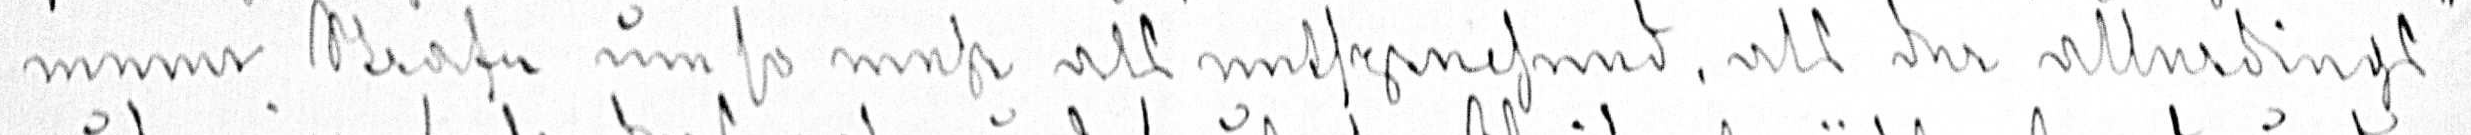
mene Strafe um so mehr als entsprechend, als der allerdings
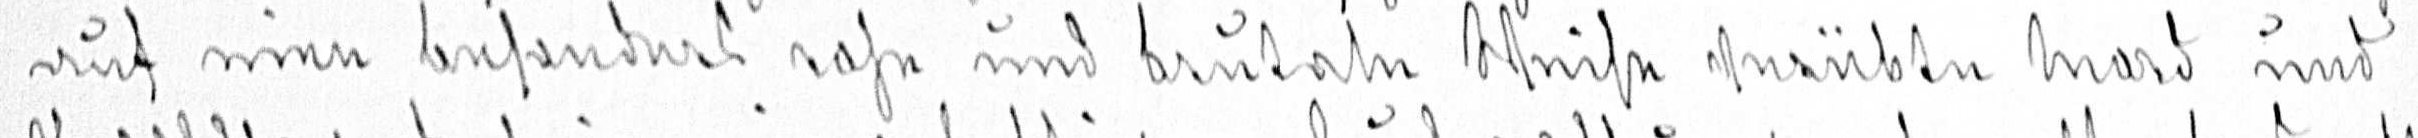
auf eine besonders nahe und brutale Weise verübten Mord und
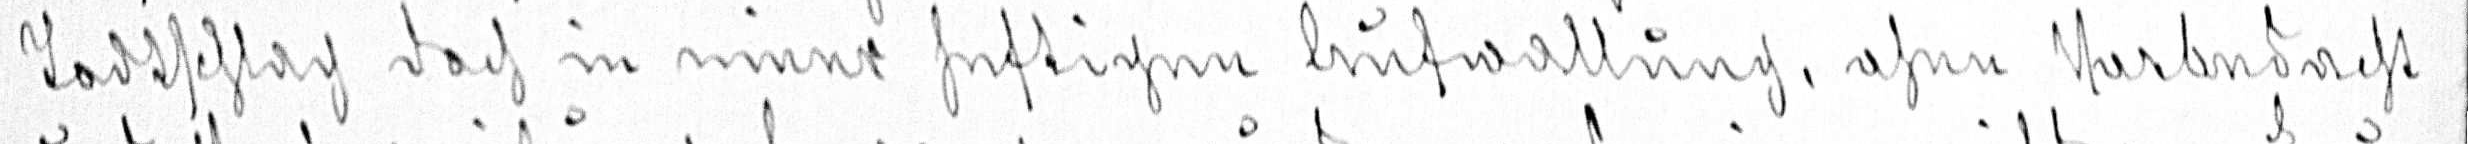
Todtschlag doch in einer heftigen Aufwallung, ohne Vorbedacht
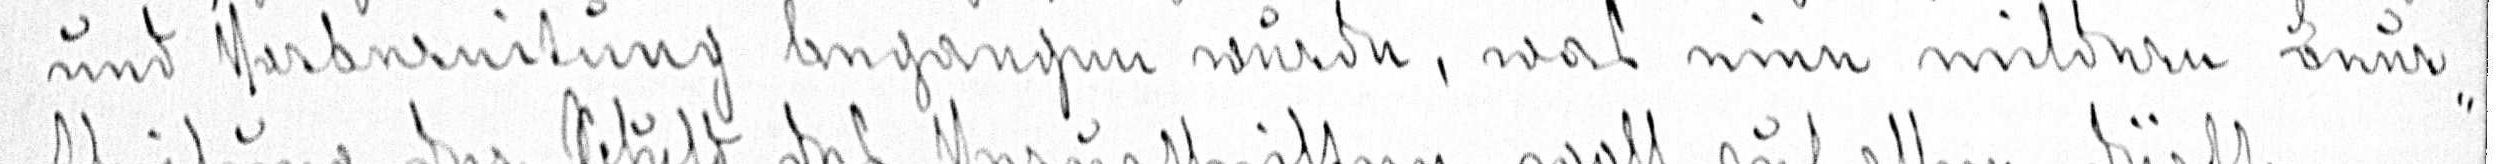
und Vorbereitung begangen wurde, was eine mildere Beur¬
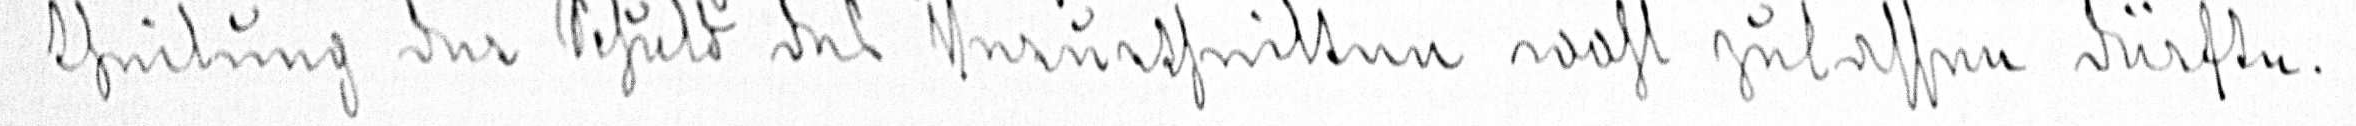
theilung der Schuld des Verurtheilten wohl zulassen dürfte.
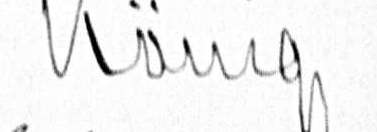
König
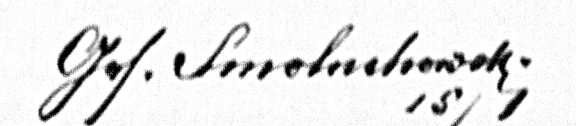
Ges. Smolnchowski
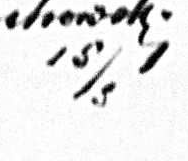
15/5
